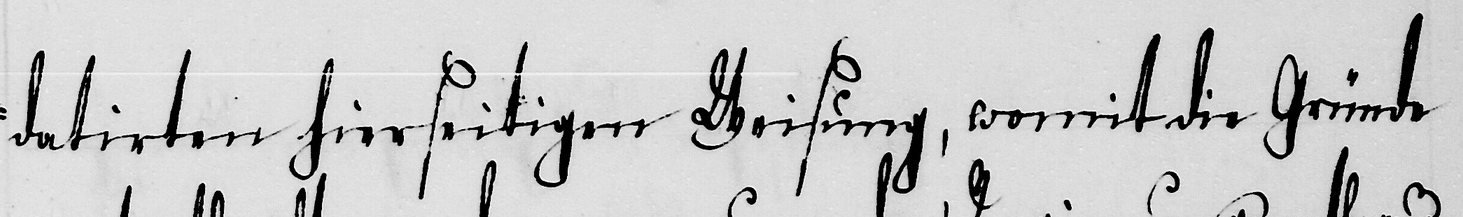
datirten hierseitigen Weisung, womit die Gründe
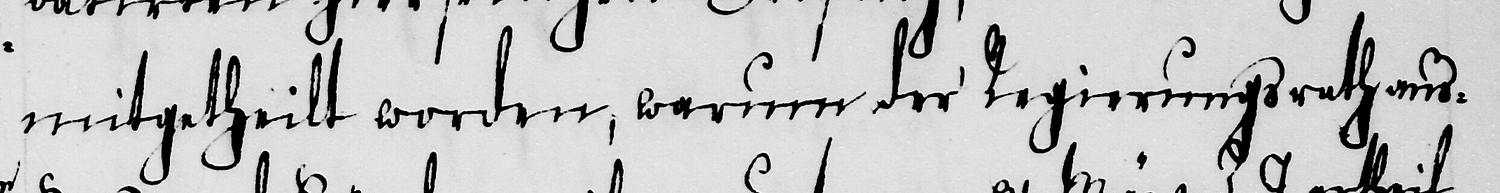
mitgetheilt worden, warum der Regierungsrath auß¬
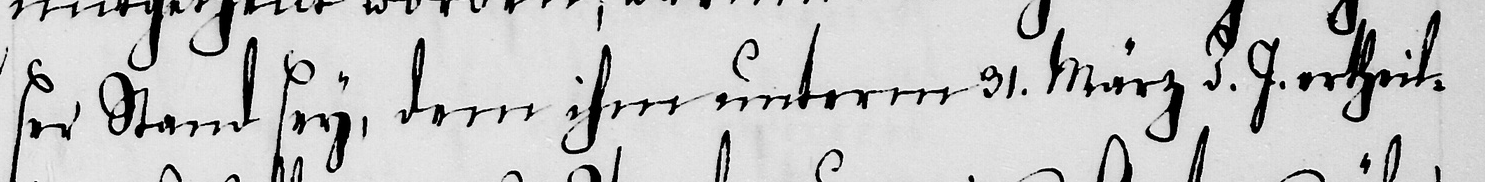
er Stand sey, dem ihm unterm 31. März d. J. ertheil¬
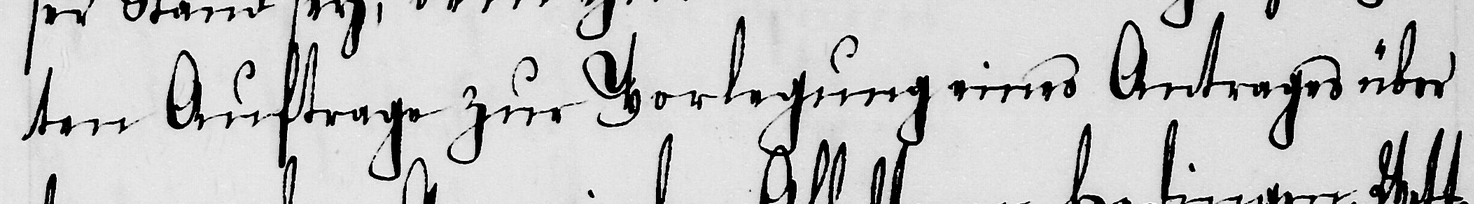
ten Auftrage zur Vorlegung eines Antrages über
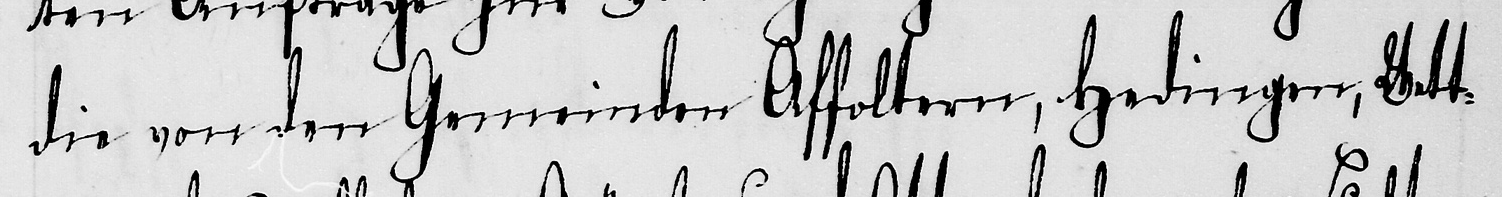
die von den Gemeinden Affoltern, Hedingen, Watt¬
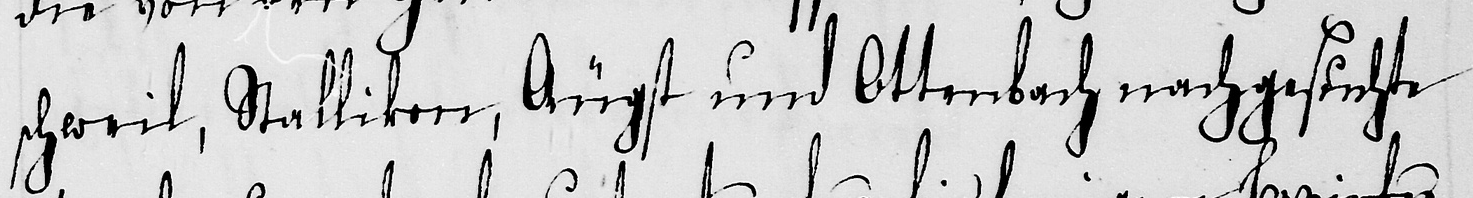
schweil, Stallikon, Äugst und Ottenbach nachgesuchte
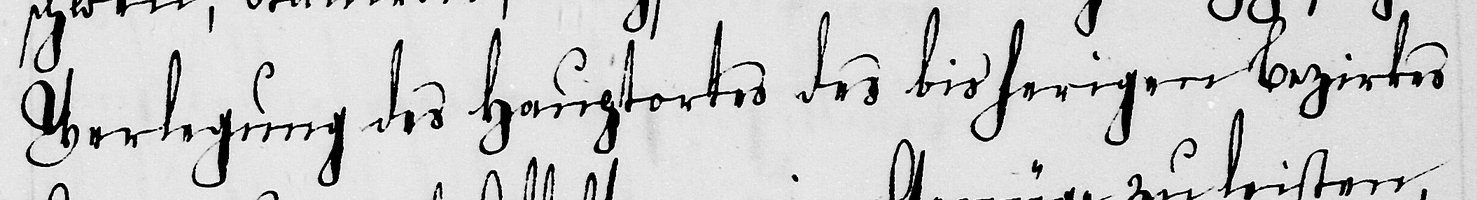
Verlegung des Hauptortes des bisherigen Bezirkes
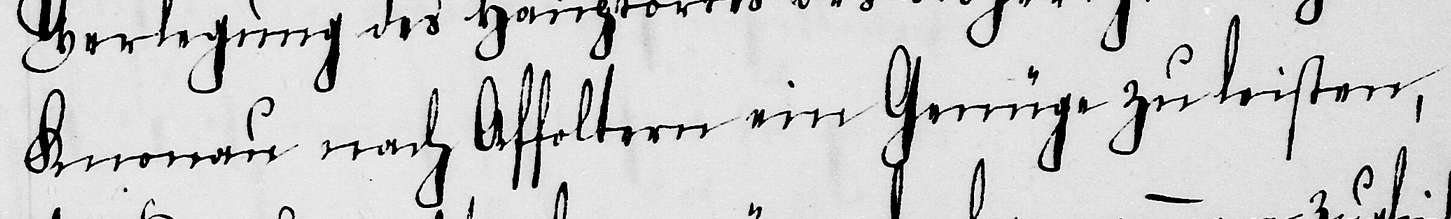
Knonau nach Affoltern ein Genüge zu leisten,
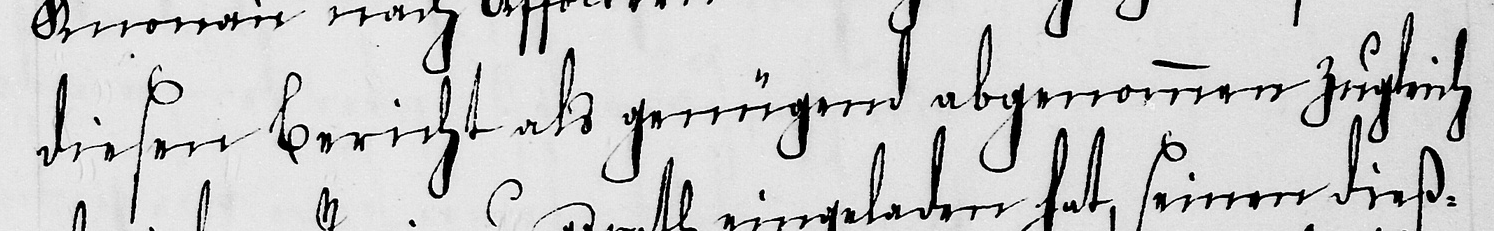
diesen Bericht als genügend abgenommen zugleich
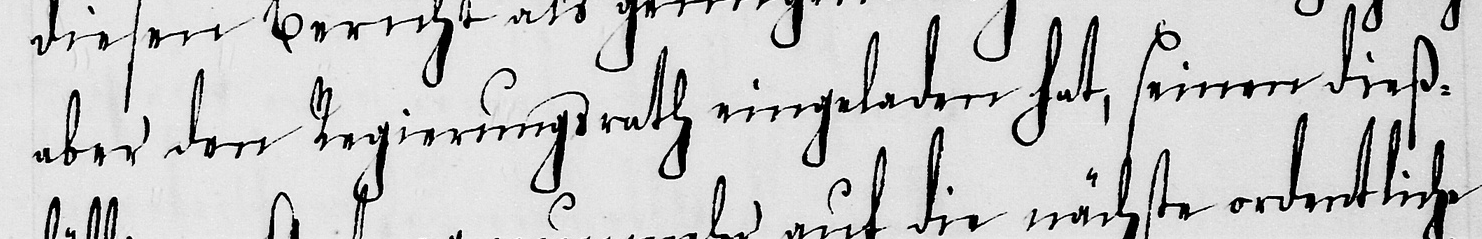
aber den Regierungsrath eingeladen hat, seinen dieß¬
